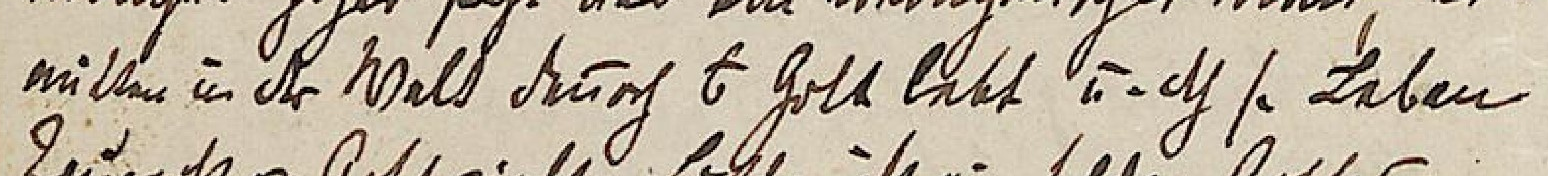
mitten in dr Welt denoch s Gott lebt u. dch s. Leben
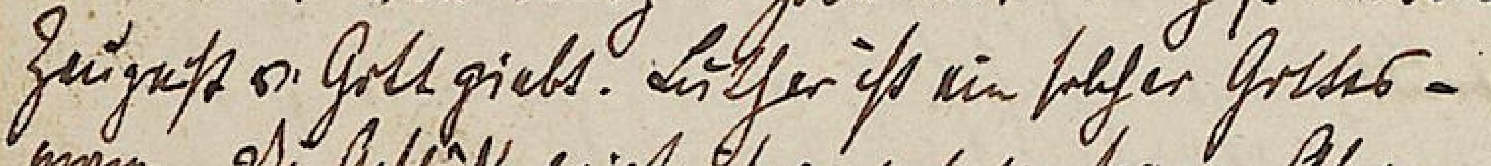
Zeugniß v. Gott gieht. Luther ist ein solcher Gottes¬
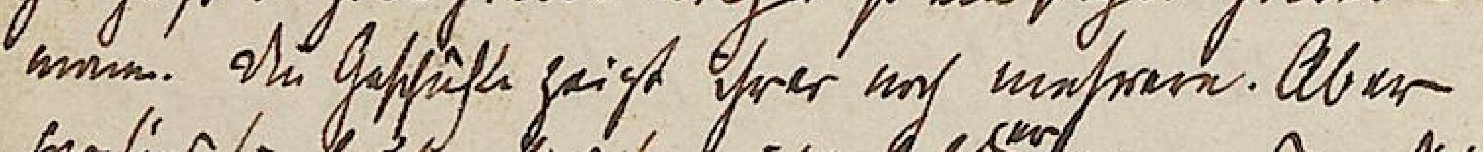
mann. Die Geschichte zeigt ihrer noch mehrere. Aber
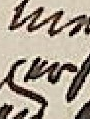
er
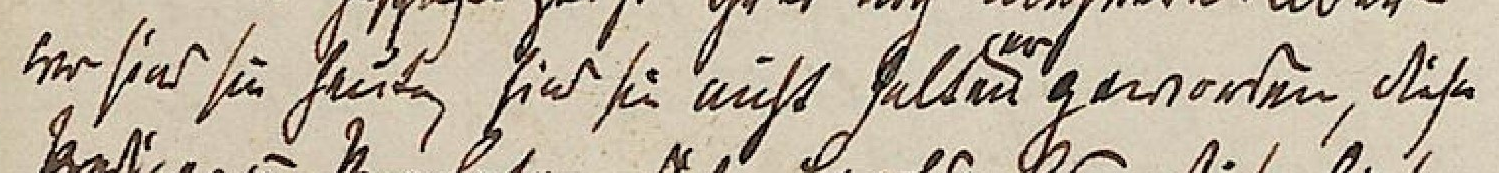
wo sind sie heute, sind sie nicht selten geworden, diese
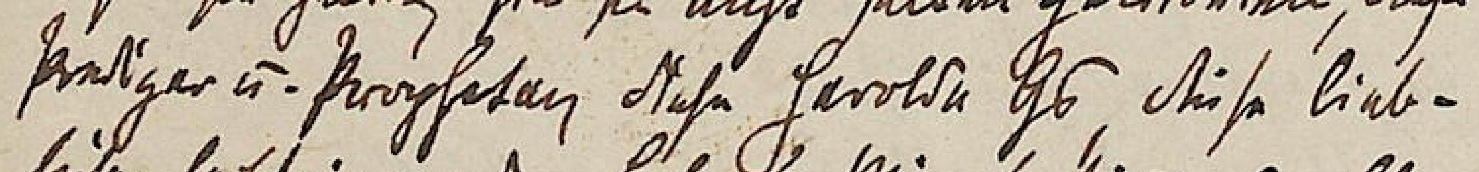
Prediger u. Propheten, diese Herolde Gs, diese lieb¬
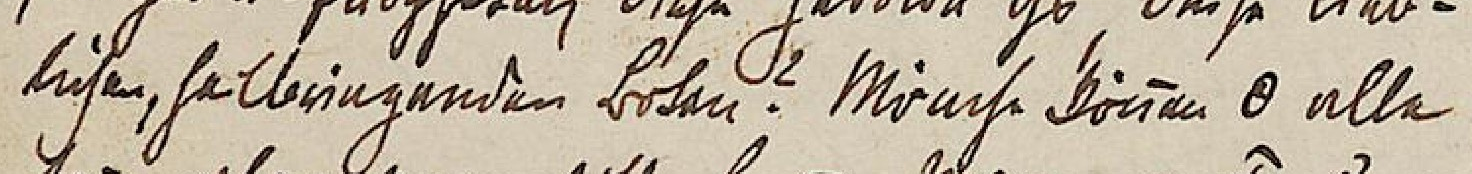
liche, heilbringenden Boten? Mönche könen o alle
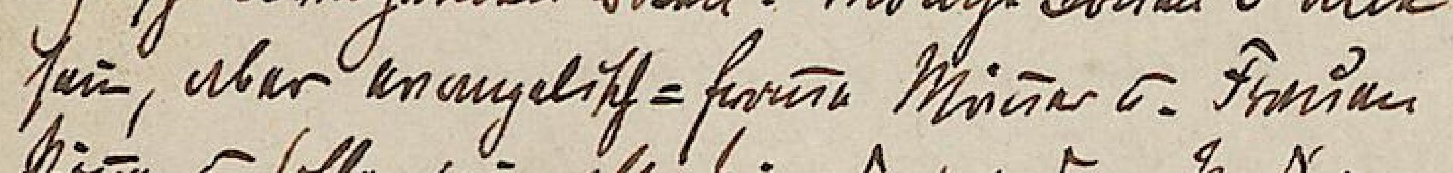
sein, aber evangelische-frome Mäner u. Frauen
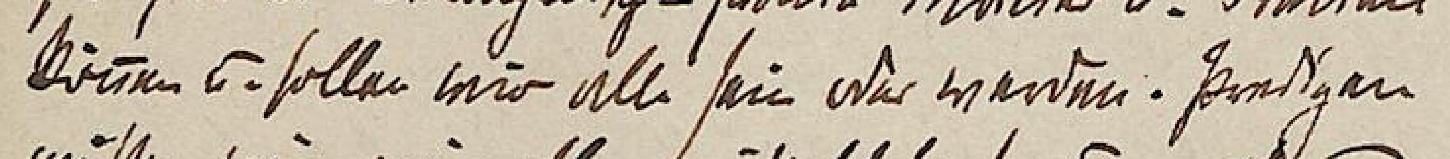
könen u. sollen wir alle sein oder werden. Predigen
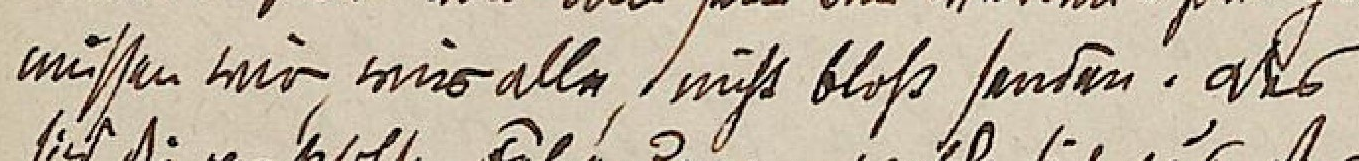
müssen wir, wir alle, nicht bloß senden. Das
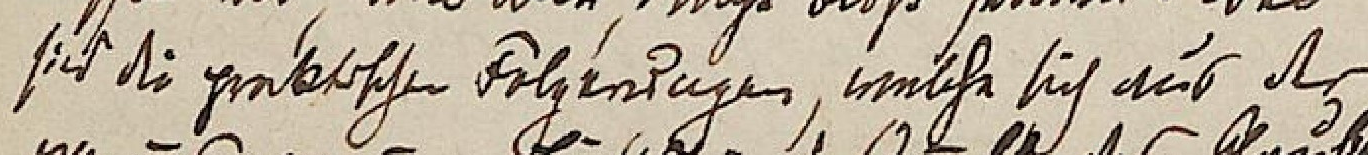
sind die praktischen Folgerungen, welche sich aus der
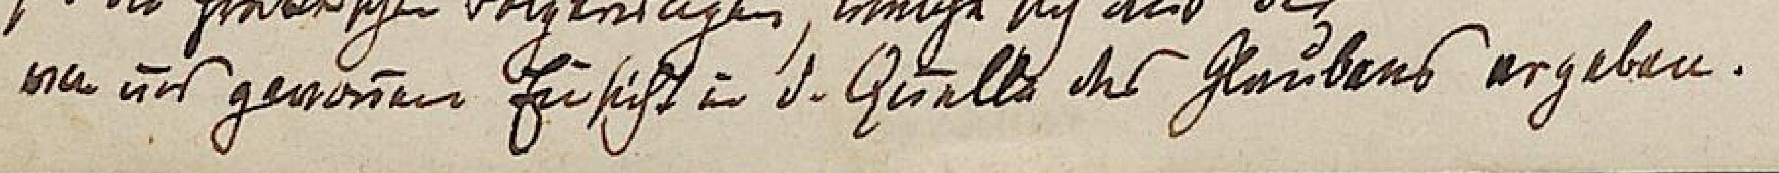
von uns gewonen Einsicht in d. Quelle des Glaubens ergeben.
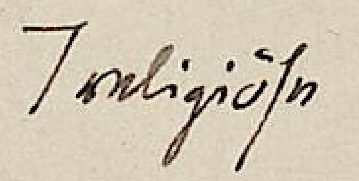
Freigeist
